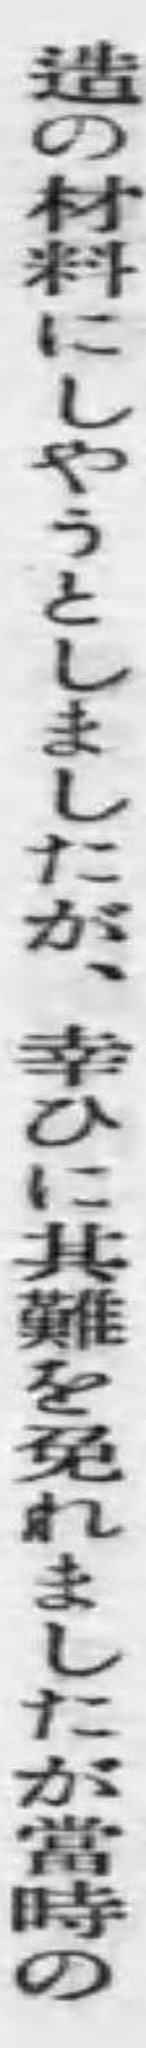造の材料にしやうとしましたが、幸ひに其難を免れましたが当時の
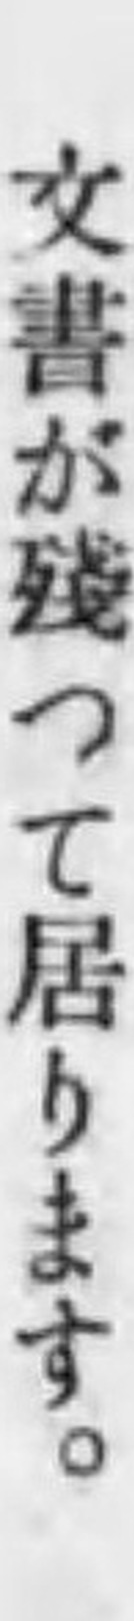文書が残つて居ります。
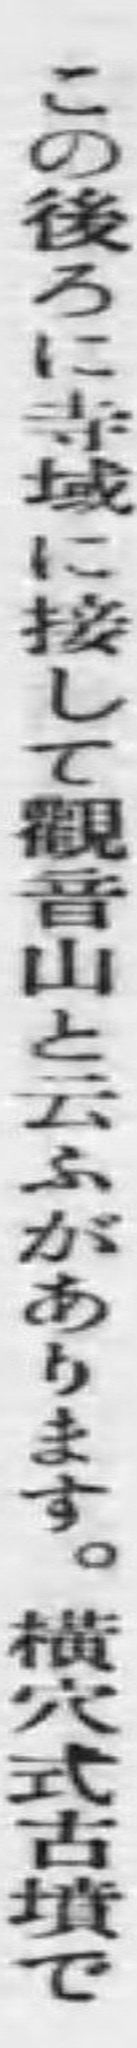この後ろに寺域に接して観音山と云ふがあります。横穴式古墳で
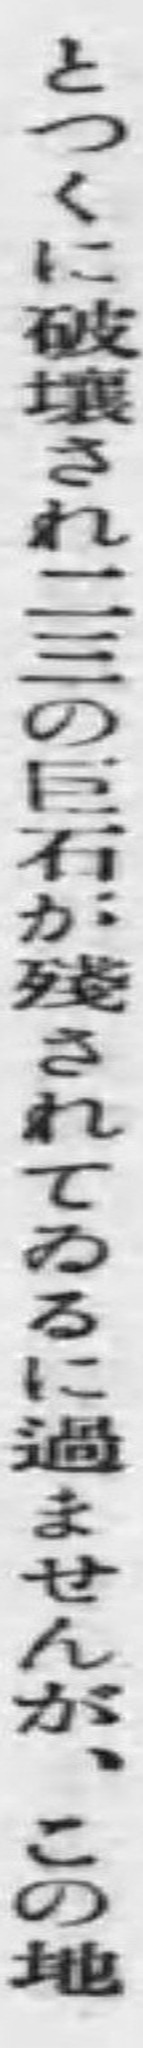とつくに破壊され二三の巨石が残されてゐるに過ませんが、この地
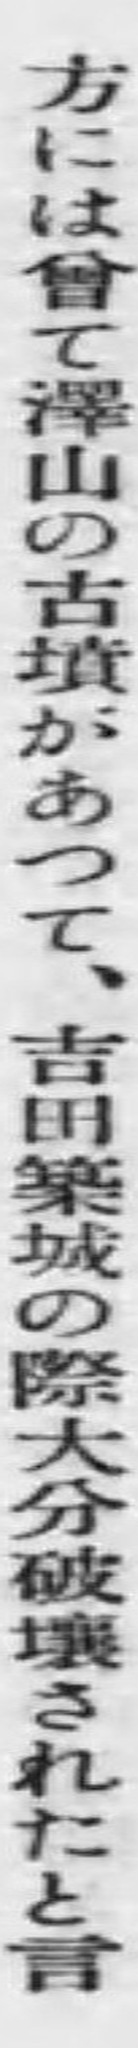方には曽て沢山の古墳があつて、吉田築城の際大分破壊されたと言
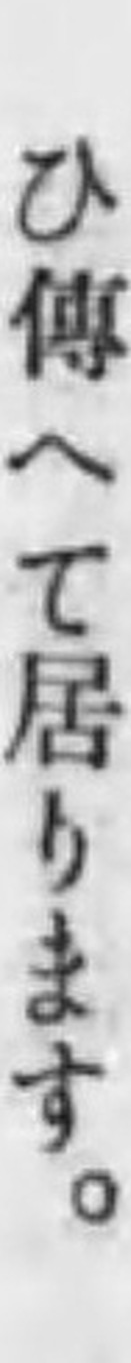ひ伝へて居ります。
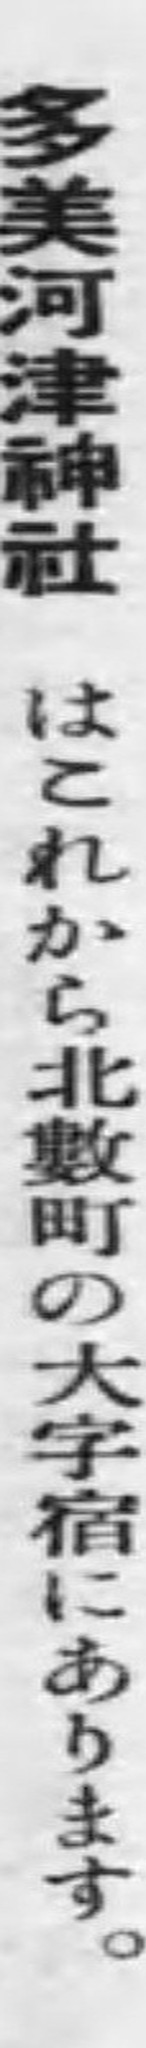多美河津神社はこれから北数町の大字宿にあります。
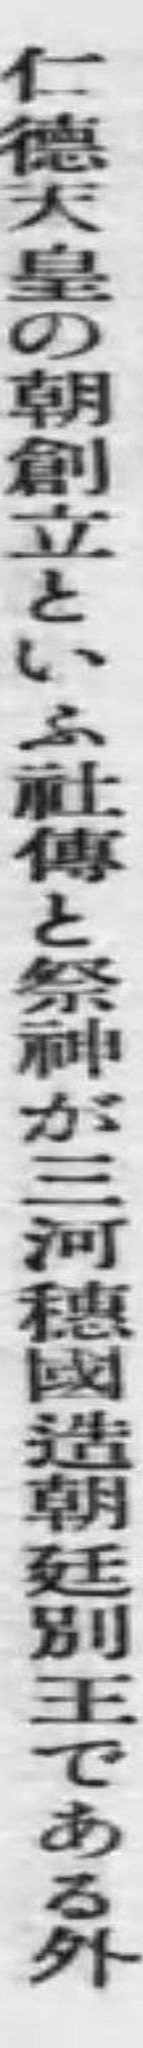仁徳天皇の朝創立といふ社伝と祭神が三河穂国造朝廷別王である外
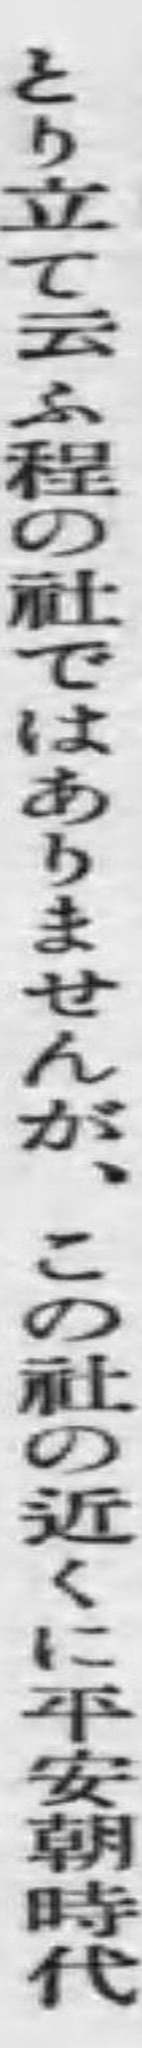とり立て云ふ程の社ではありませんが、この社の近くに平安朝時代
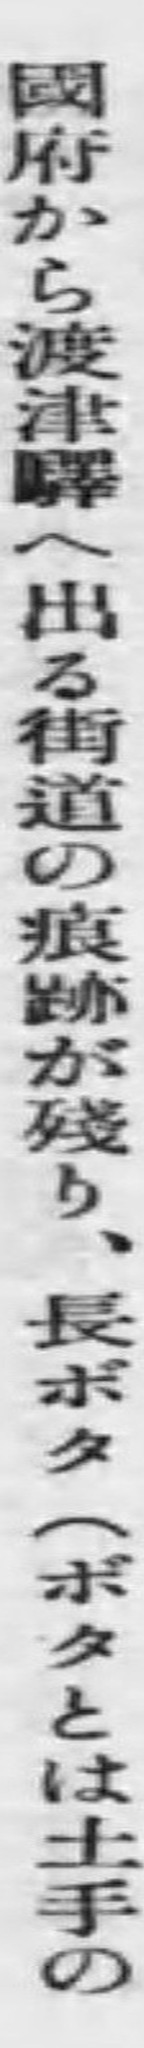国府から渡津駅へ出る街道の痕跡が残り、長ボタ(ボタとは土手の
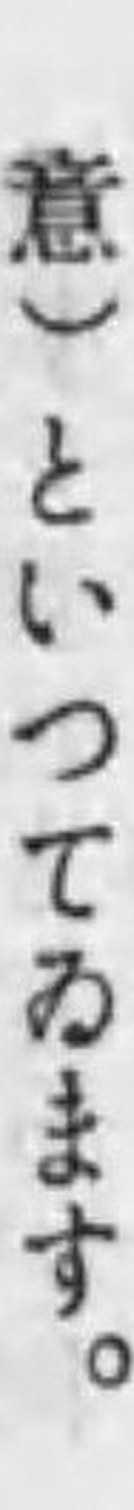意)といつてゐます。
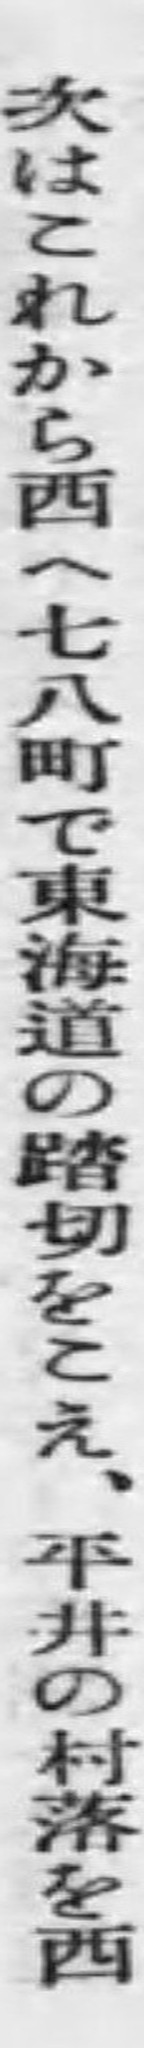次はこれから西へ七八町で東海道の踏切をこえ、平井の村落を西
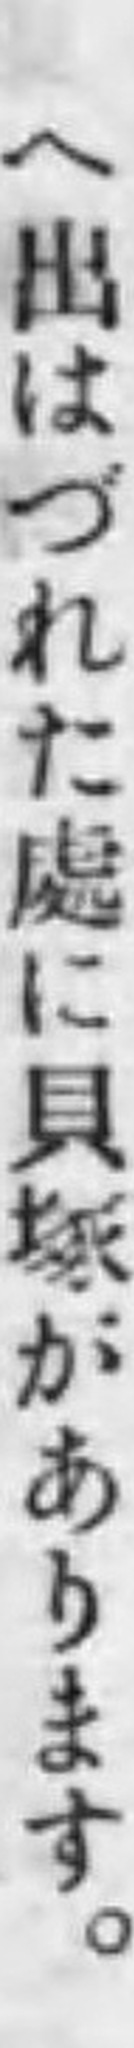へ出はづれた処に貝塚があります。
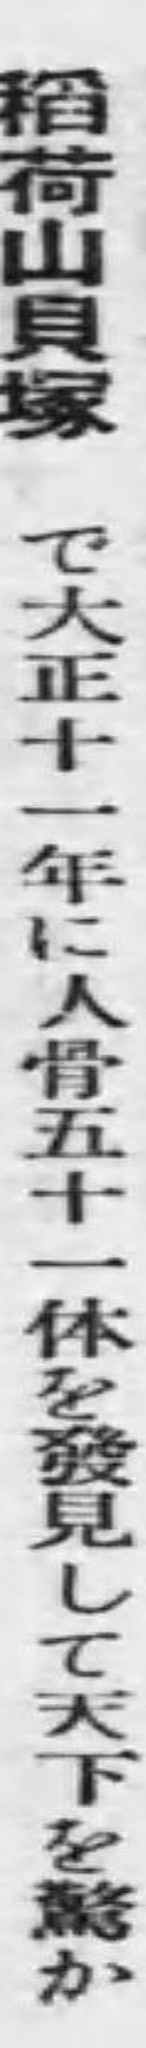稲荷山貝塚で大正十一年に人骨五十一体を発見して天下を驚か
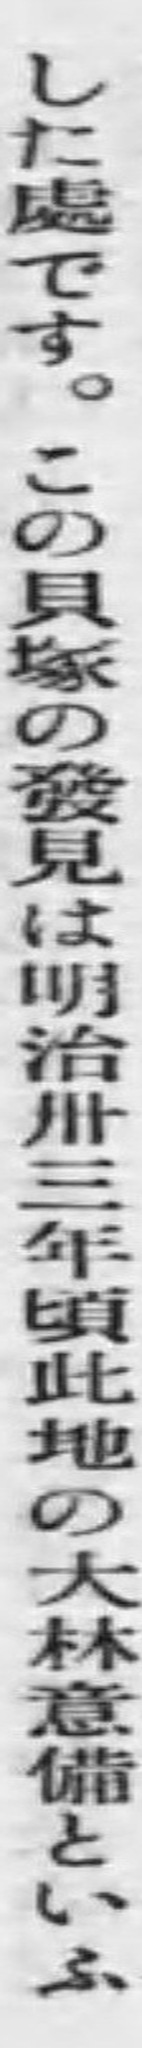した処です。この貝塚の発見は明治卅三年頃此地の大林意備といふ
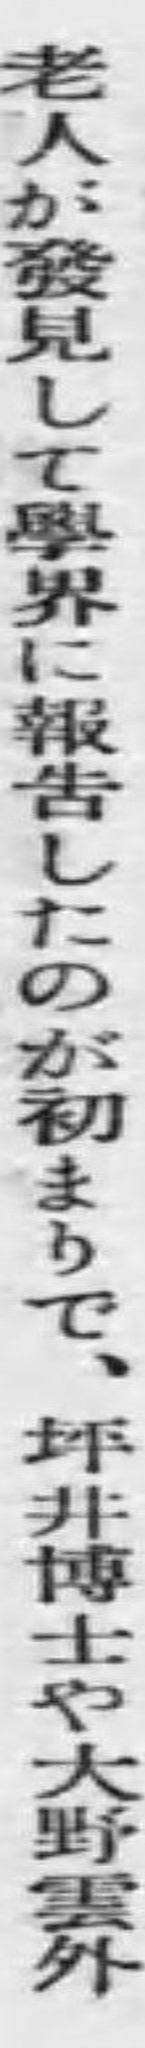老人が発見して学界に報告したのが初まりで、坪井博士や大野雲外
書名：東三河道中記 : 豊橋市及其附近案内
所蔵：国立国会図書館 National Diet Library, JAPAN
